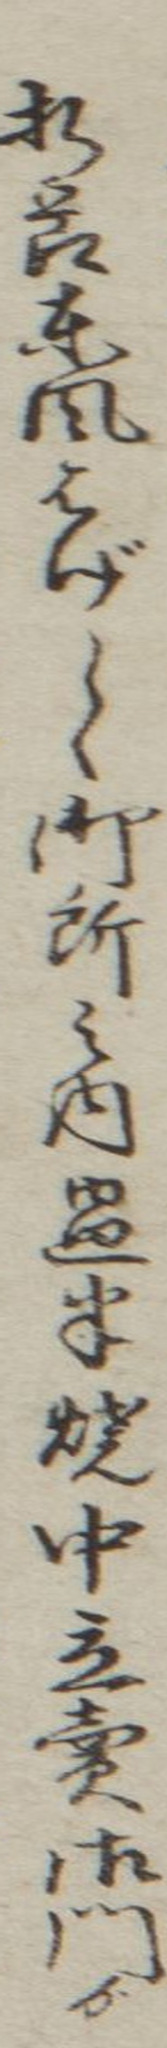折節東風はげしく御所之内過半焼中立売御門より
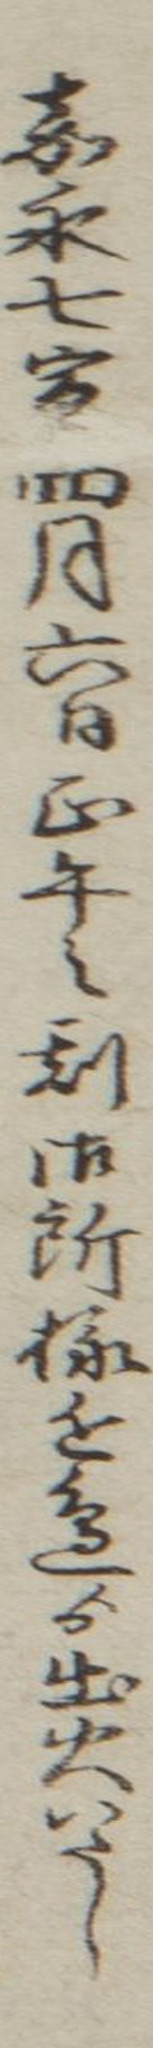嘉永七寅四月六日正午之刻御所様近辺より出火いたし
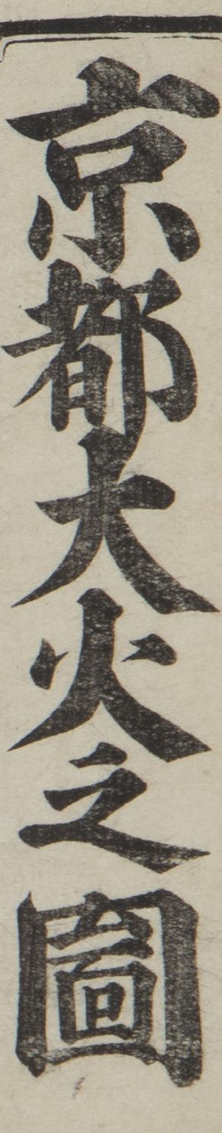京都大火之圖
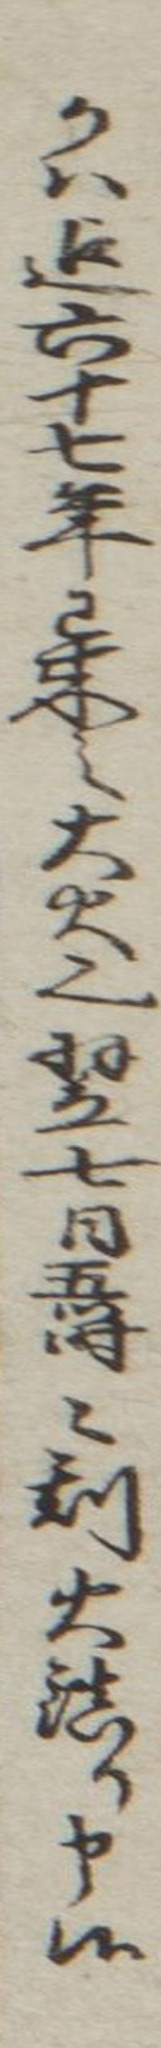かは迄六十七年已来之大火也翌七日五ツ時之刻火鎮り申候
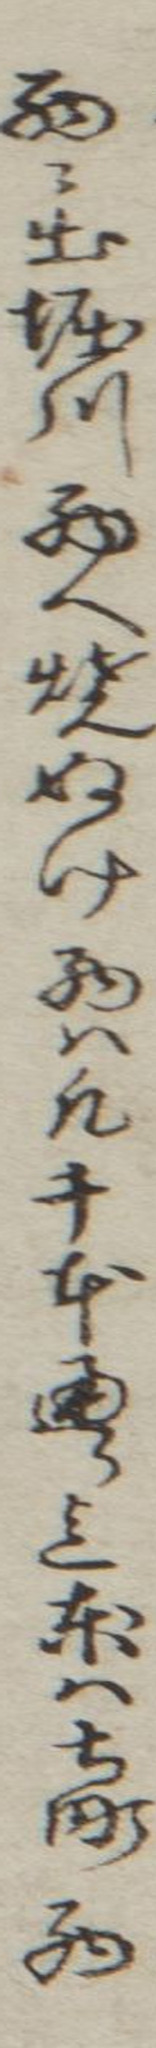西に出堀川西へ焼ぬけ西は凡千本通り迄東は寺町西
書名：京都大火之図
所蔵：あいおいニッセイ同和損保株式会社
